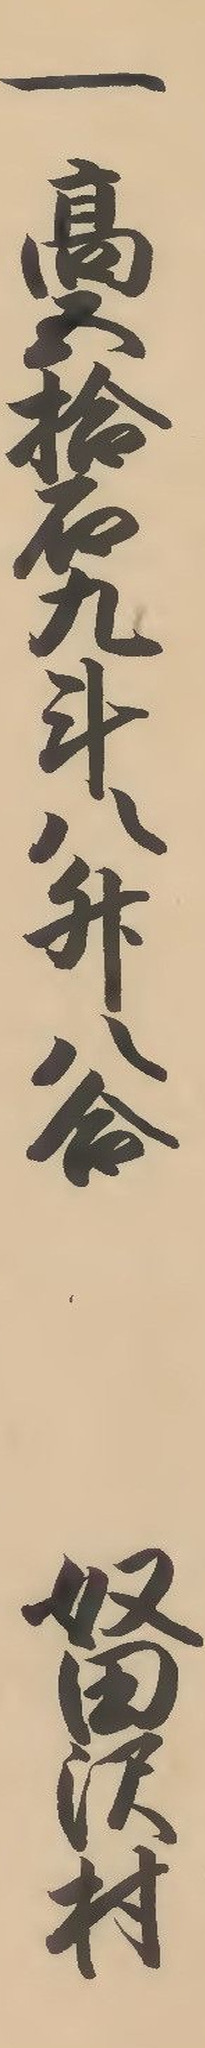一高五拾石九斗八升八合奴田沢村
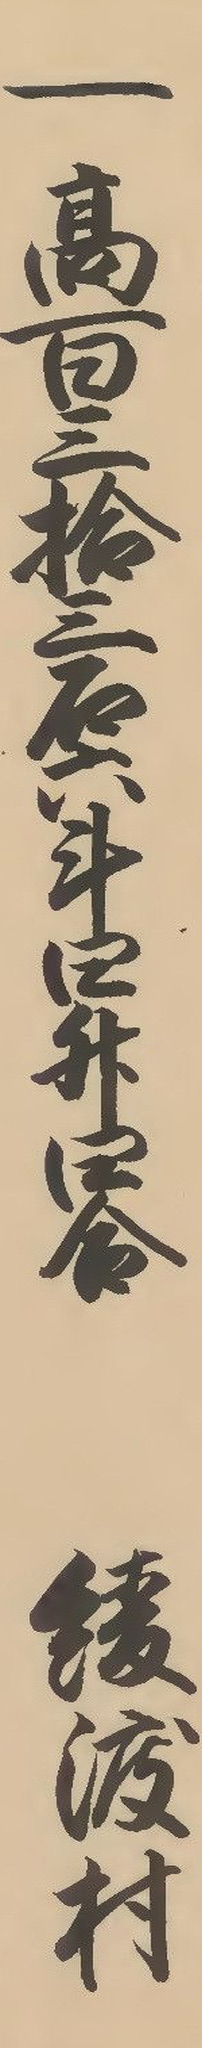一高百三拾三石六斗四升四合綾渡村
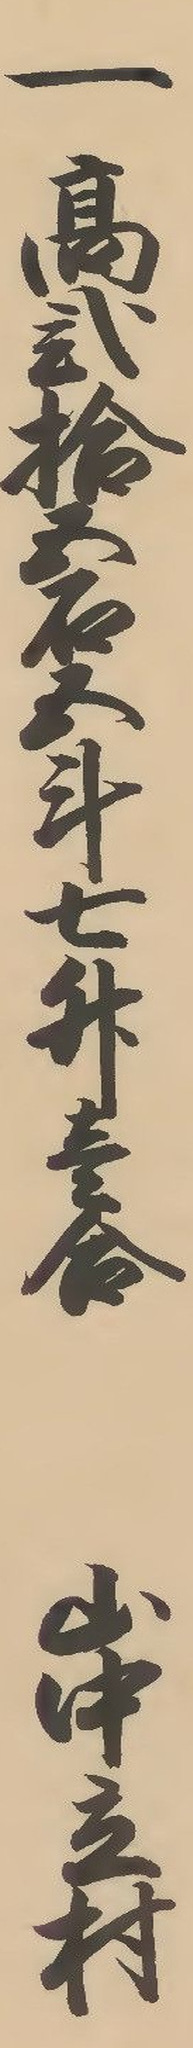一高弐拾五石五斗七升壱合山中立村

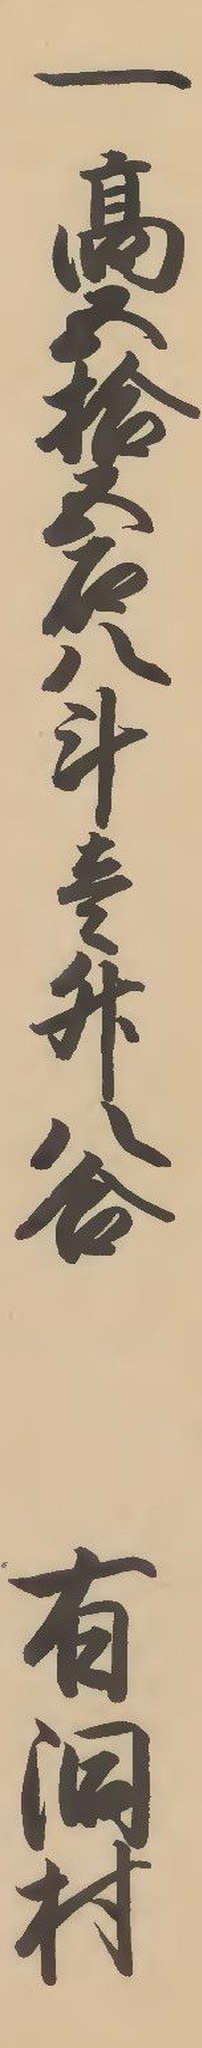一高五拾五石八斗壱升八合有洞村
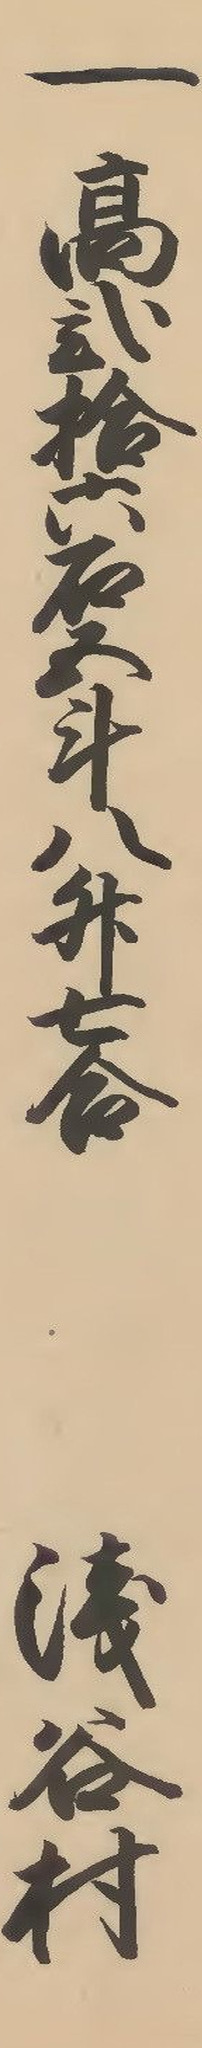一高弐拾六石五斗八升七合浅谷村
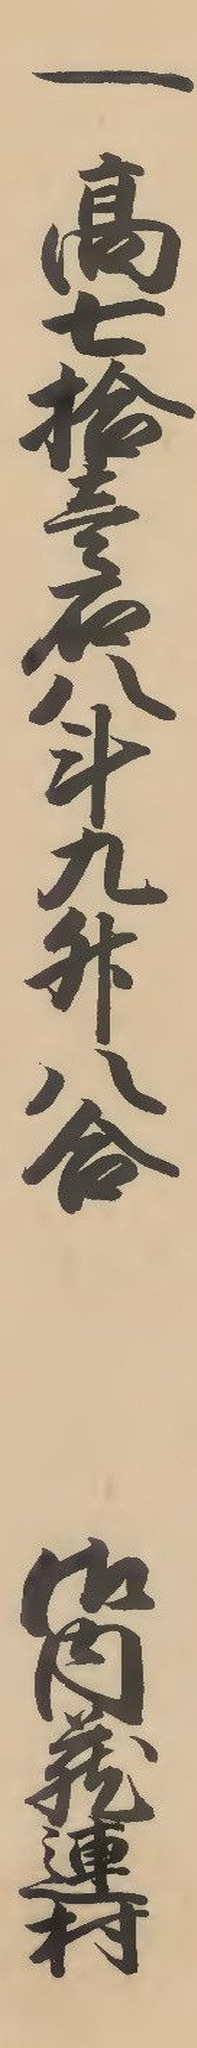一高七拾壱石八斗九升八合御内蔵連村
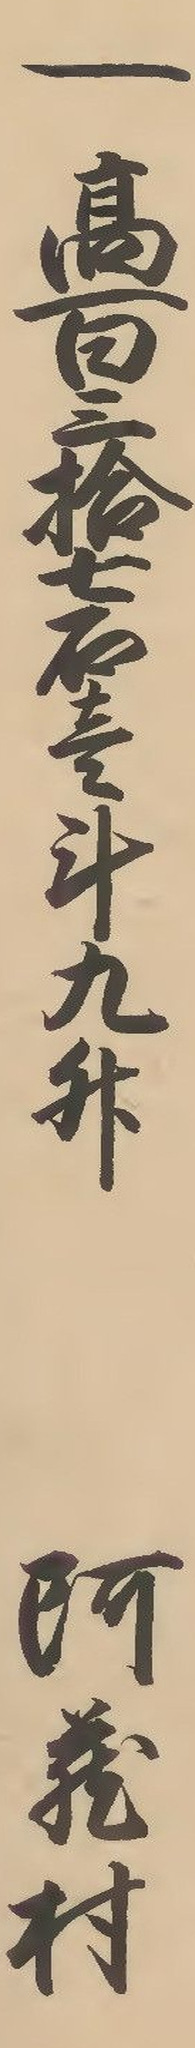一高百三拾七石壱斗九升阿蔵村
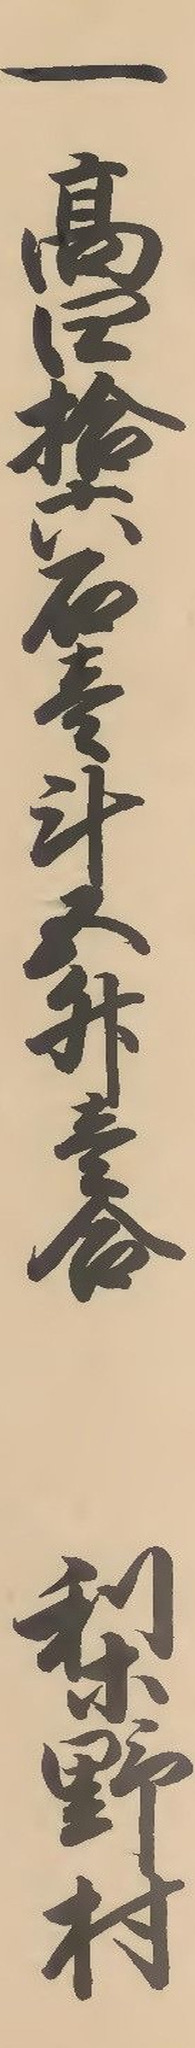一高四拾六石壱斗五升壱合梨野村
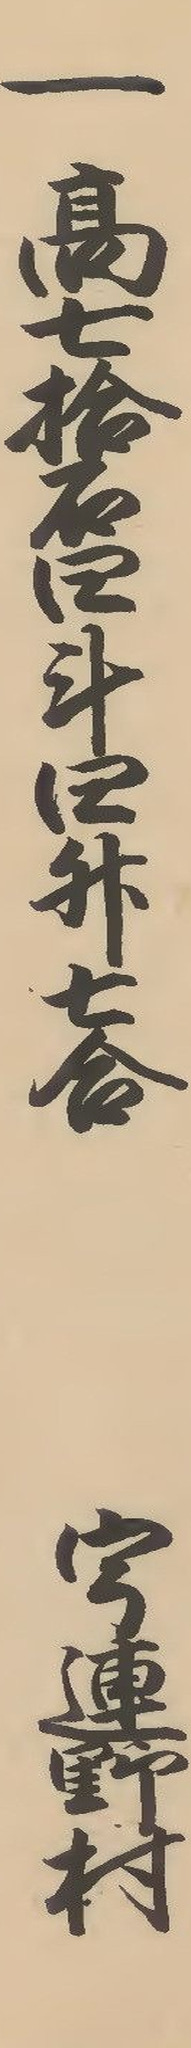一高七拾石四斗四升七合宇連野村
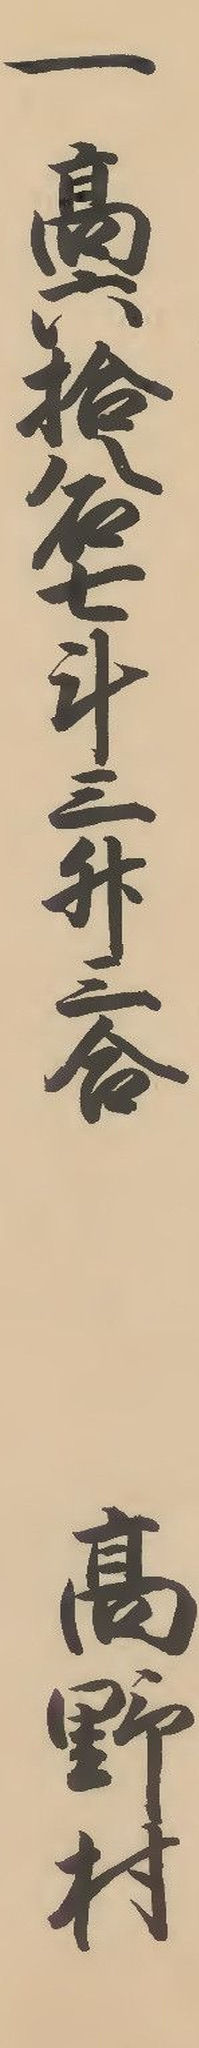一高六拾八石七斗三升三合高野村
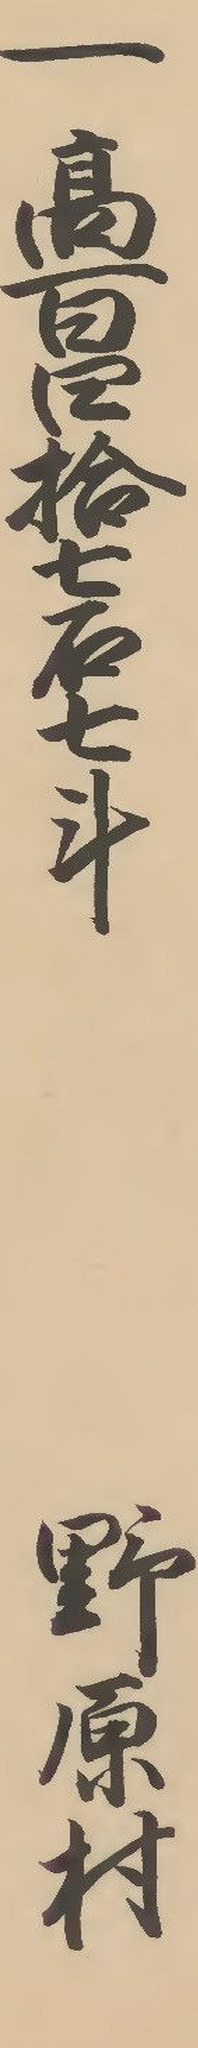一高百四拾七石七斗野原村

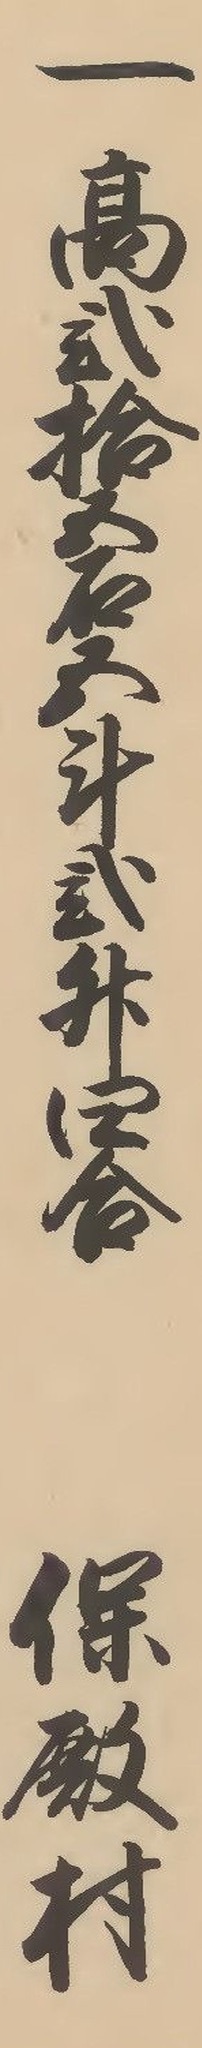一高弐拾五石五斗弐升四合保殿村
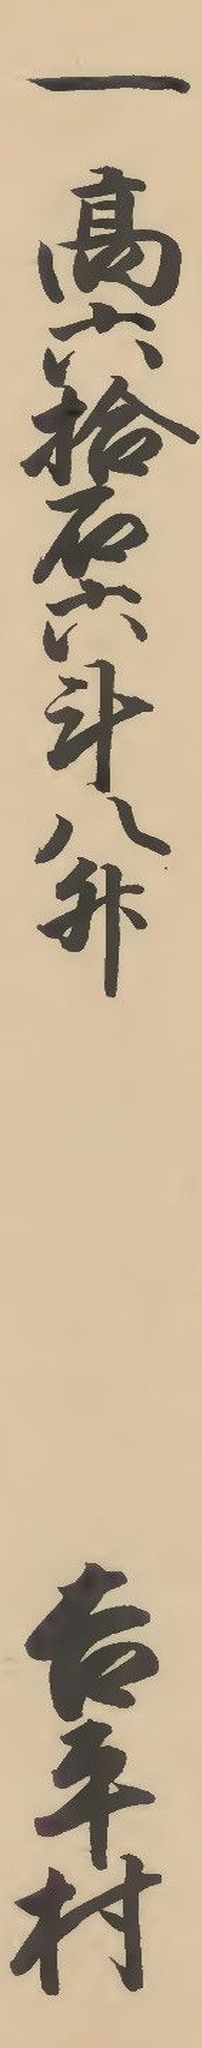一高六拾石六斗八升吉平村
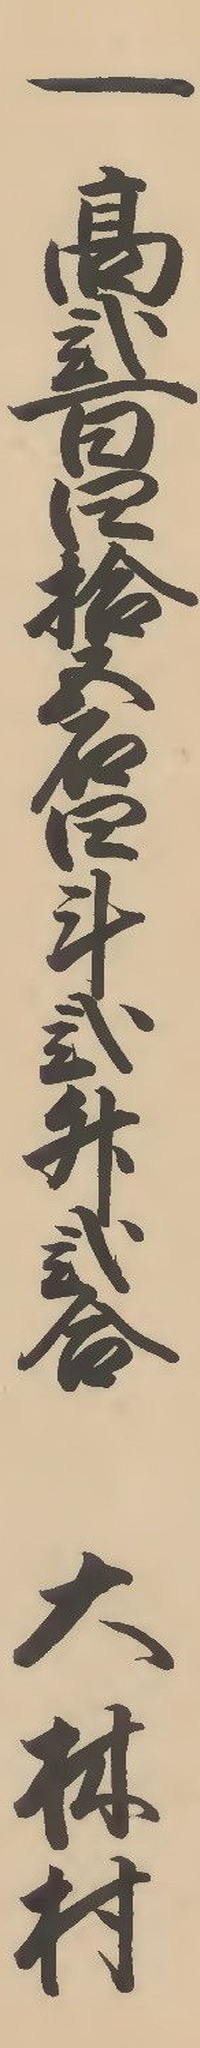一高弐百四拾五石四斗弐升弐合大林村
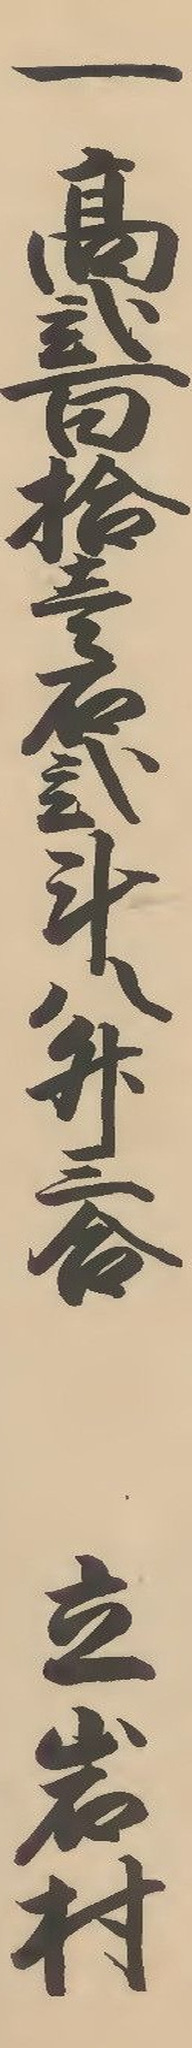一高弐百拾壱石弐斗八升三合立岩村
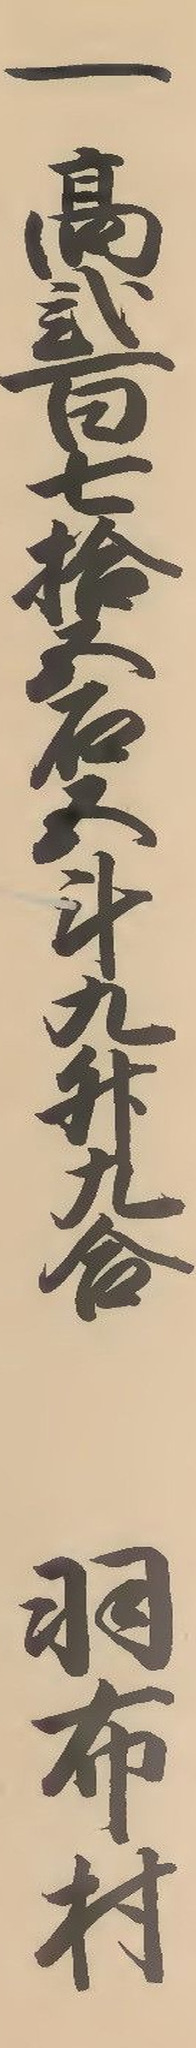一高弐百七拾五石五斗九升九合羽布村
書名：三河国郷帳
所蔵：国立公文書館 National Archives of Japan
